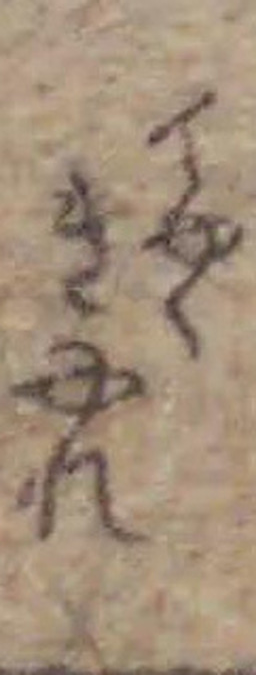きやれ
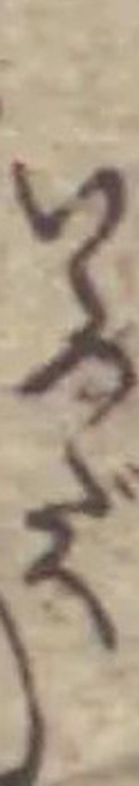いくつだへ

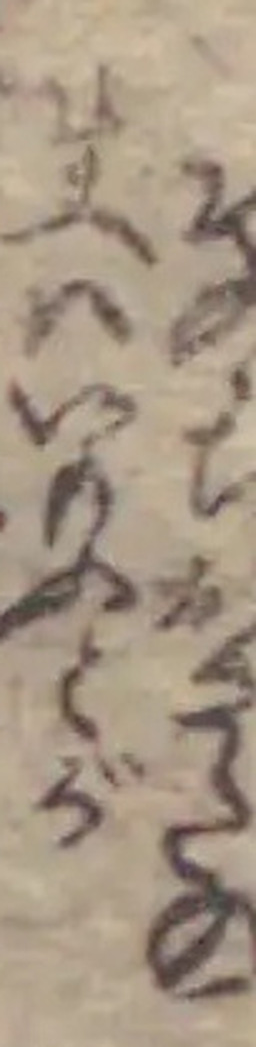まへはいもふとが
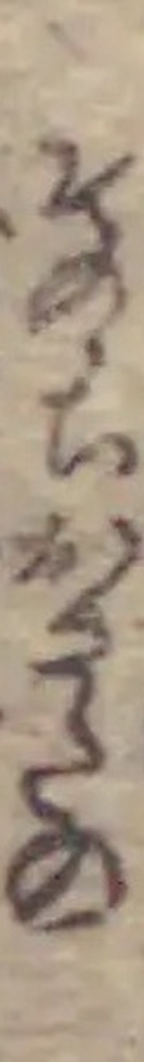そのゝちおさたの
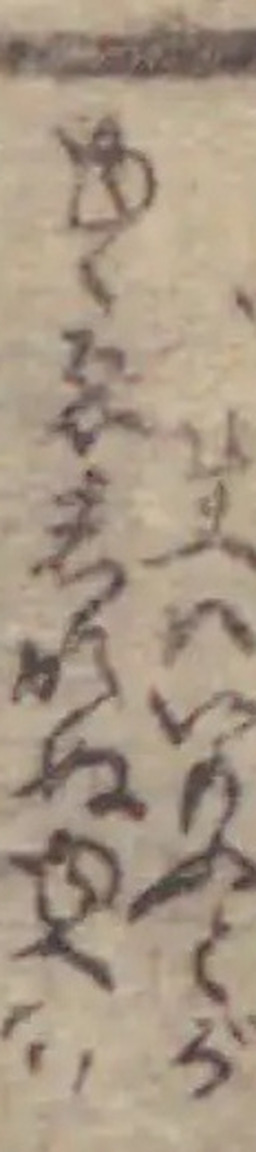ゆくゑしれぬゆへ
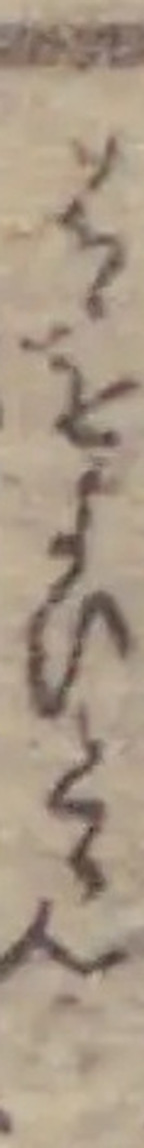はゝをよひとらん
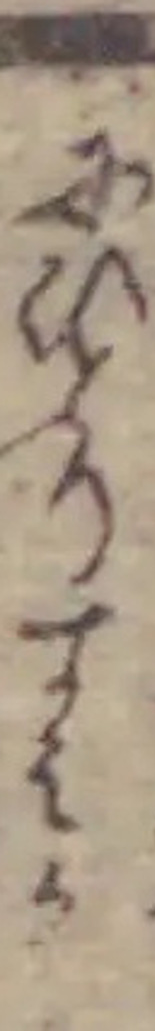にひとりすみか
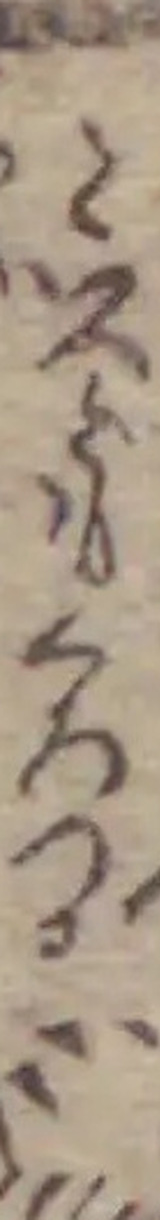といへどもくろつか
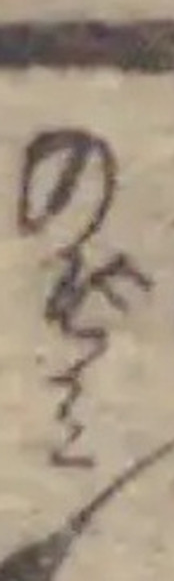のぞみ
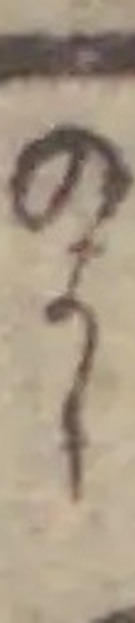のよし
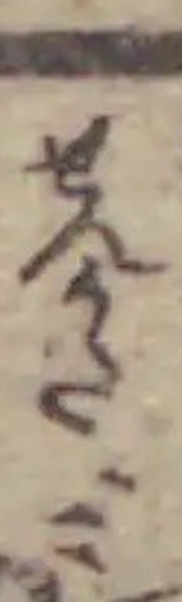せんかた
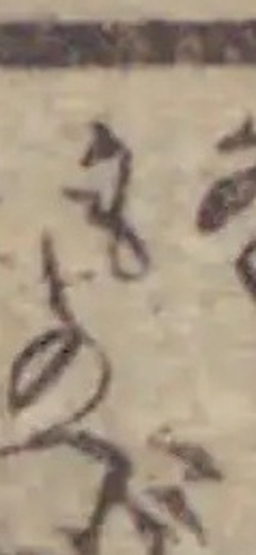かもとのへ
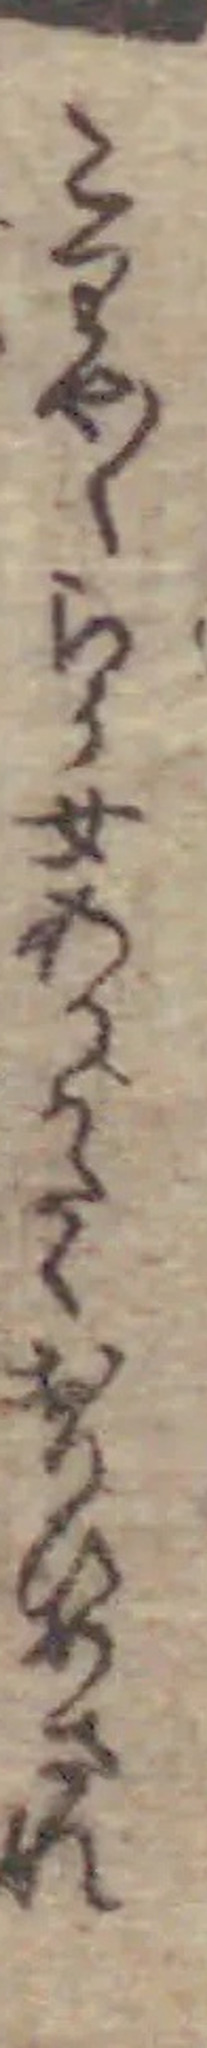こりや〳〵らう女ありかたくおかひめされ
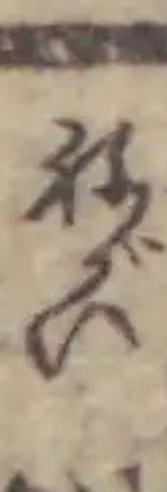ねがい
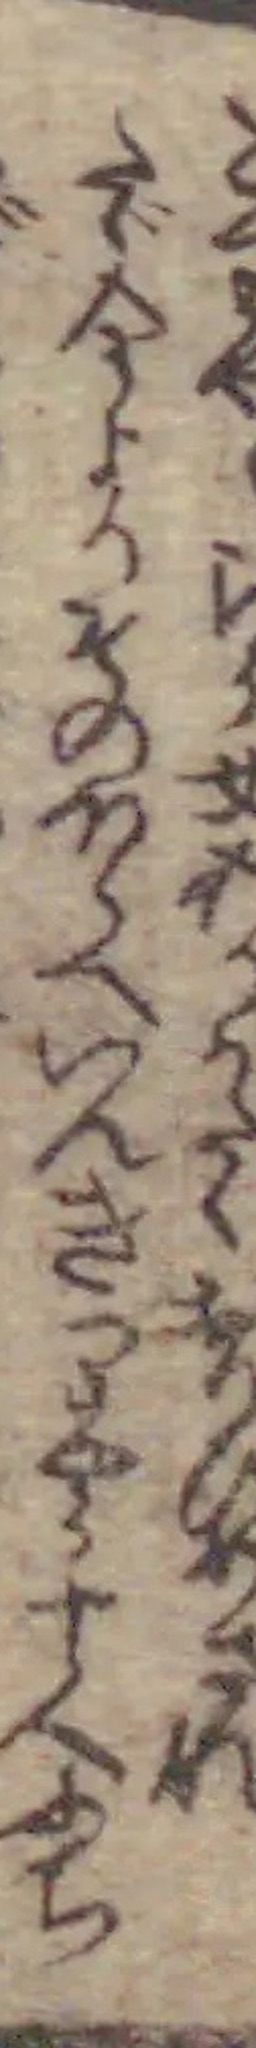たゞ今よりそのほうへいんきりやう十人ふち
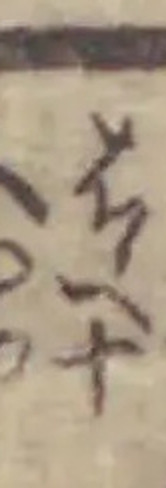はゝへ十
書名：奥州咄 3巻
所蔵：国立国会図書館 National Diet Library, JAPAN
